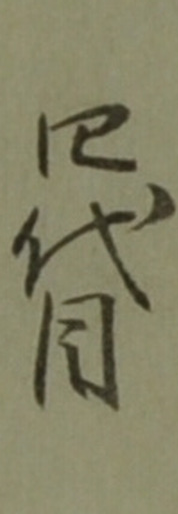四代目
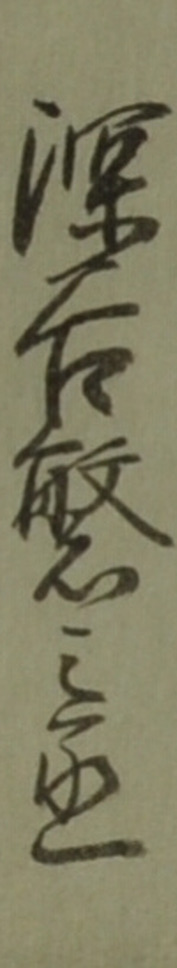深谷繁之丞
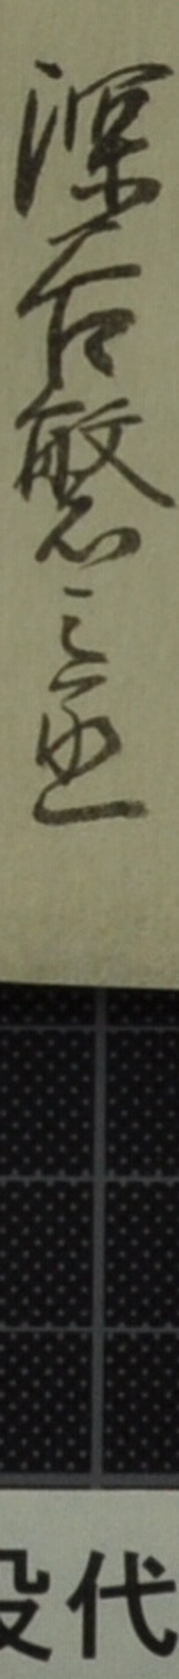深谷繁之丞
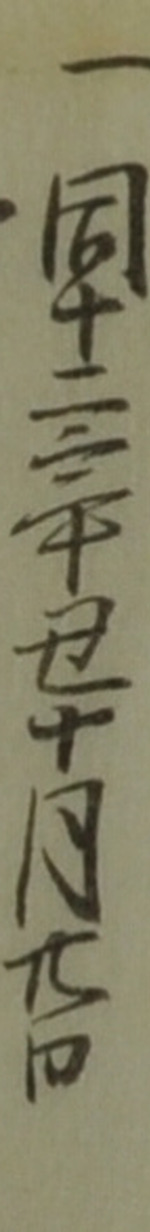一同十二辛丑十月廿日
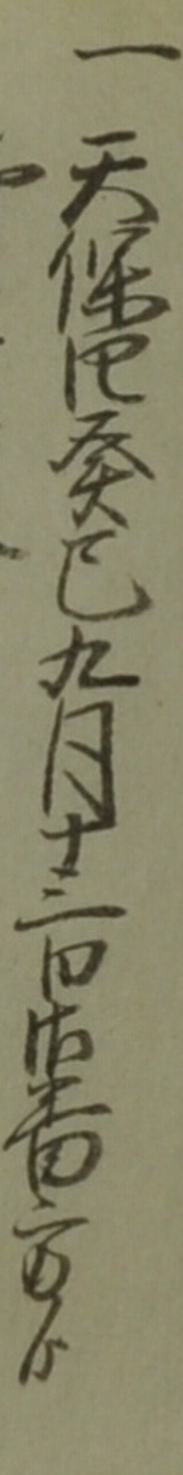一天保四癸巳九月十三日御番方ゟ
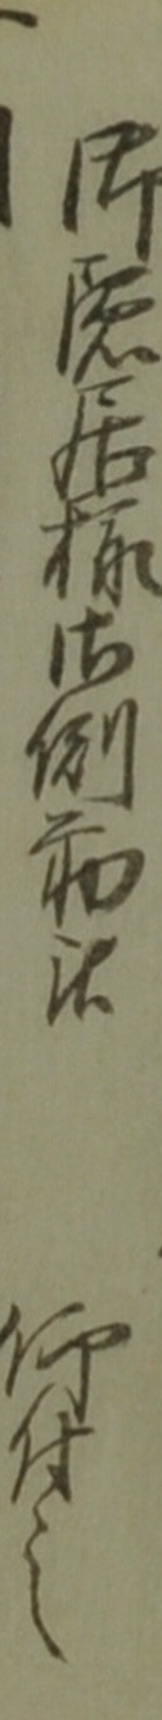御隠居様御側勤被仰付之
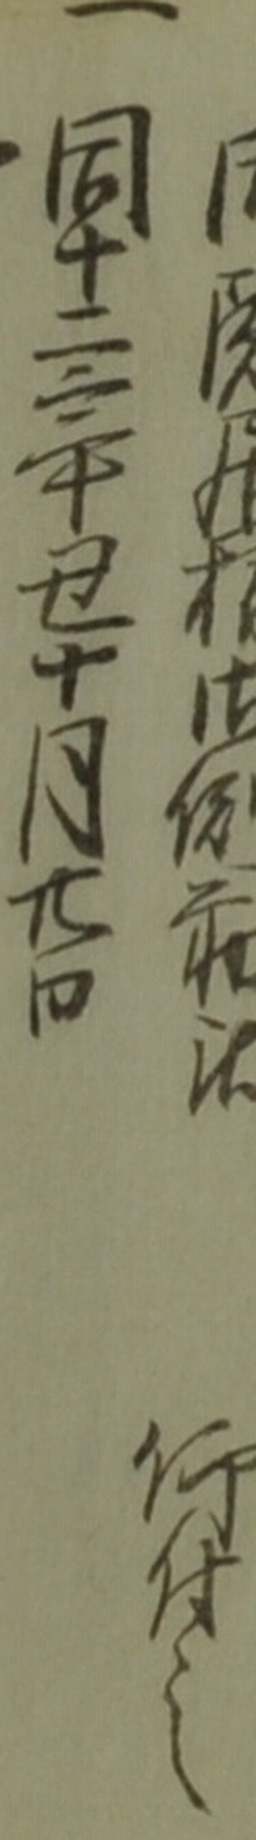一同十二辛丑十月廿日
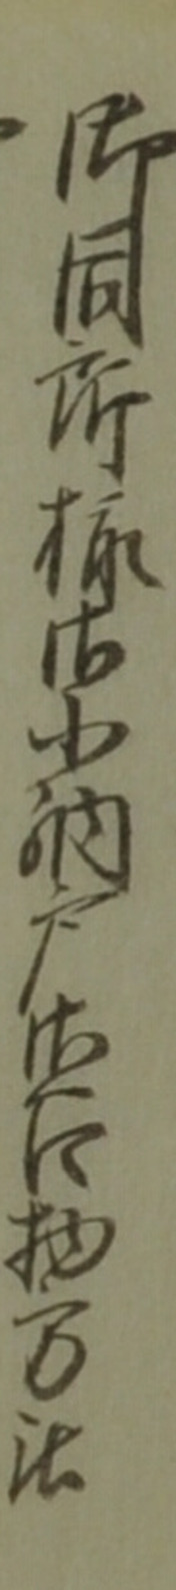御同所様御小納戸御召物方被
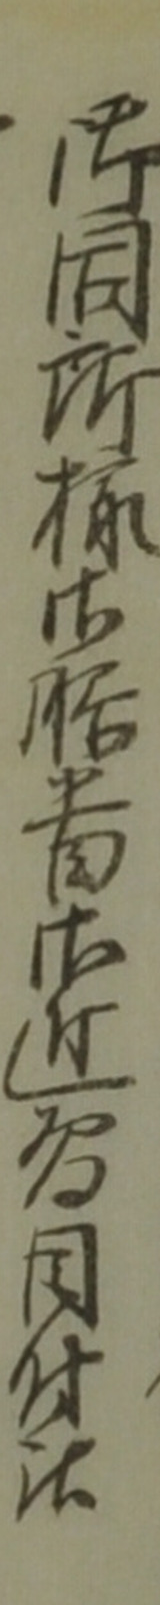御同所様御膳番御近習目付被
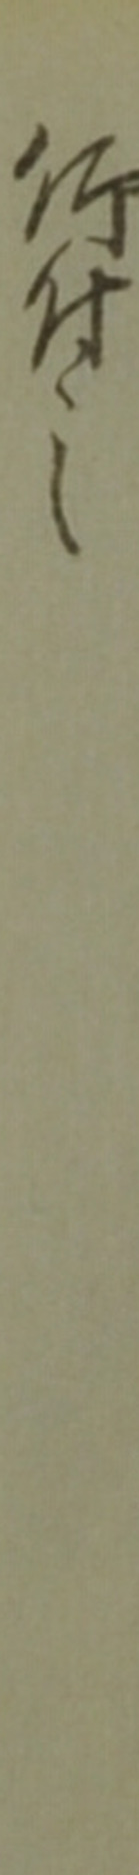仰付之
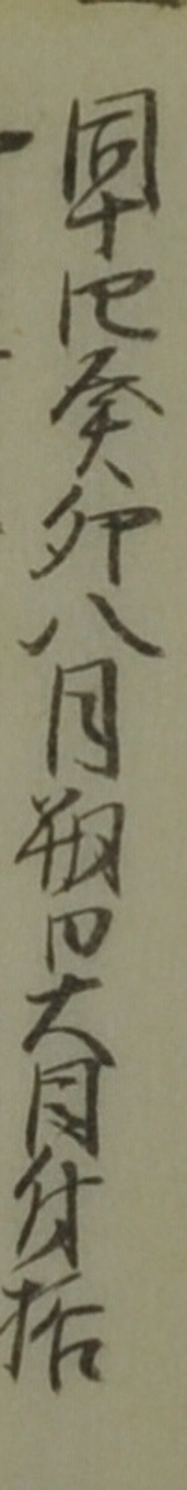一同十四癸卯八月朔日大目付格
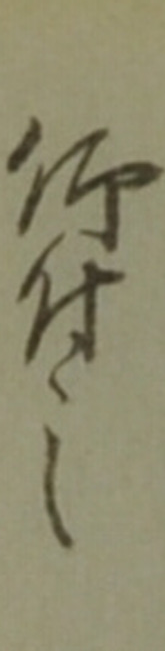仰付之
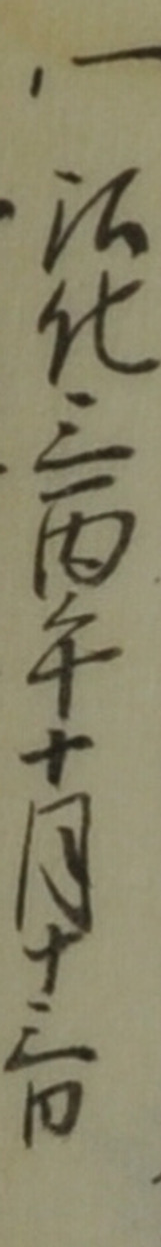一弘化三丙午十月十三日
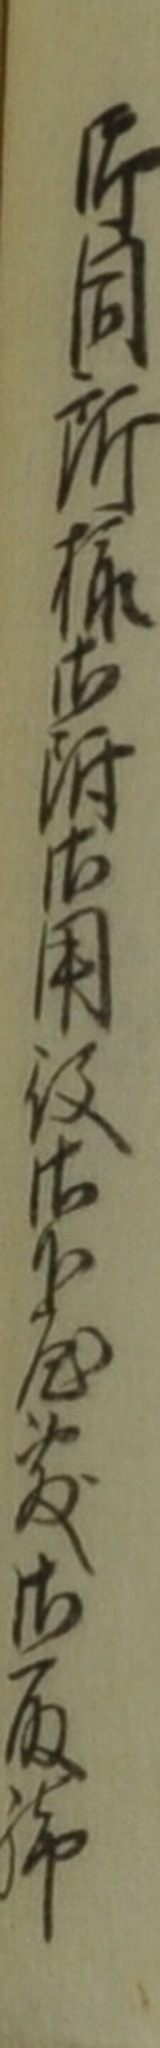御同所様御附御用役御下屋敷御取締
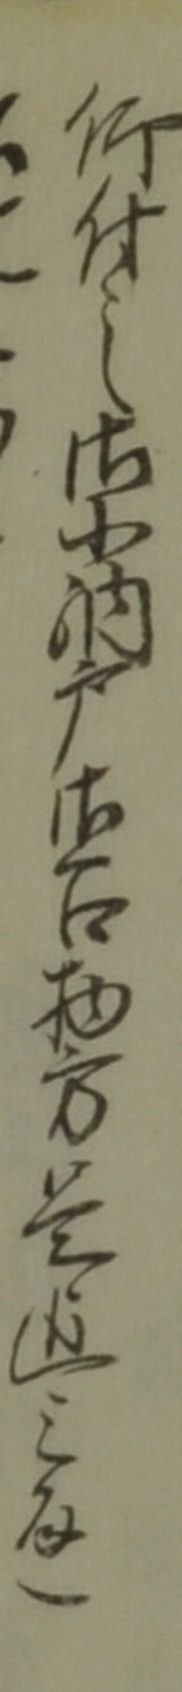仰付之御小納戸目付方是迄之通
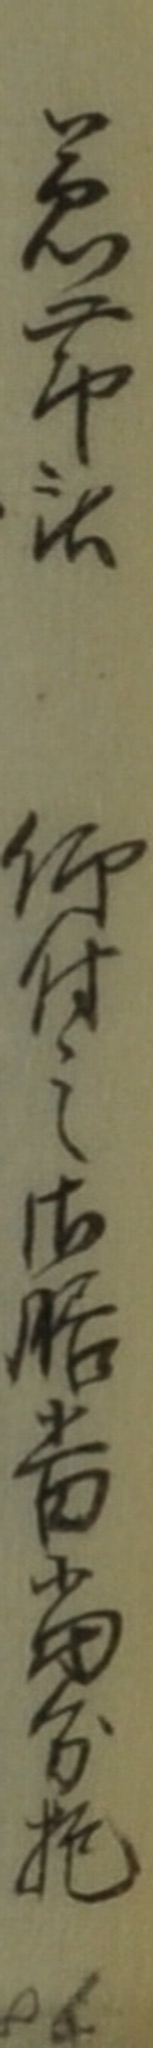兼帯被仰付之御膳番当分抱
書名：諸御役代々録（五）
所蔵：伊那市立高遠町図書館・合同会社AMANE
